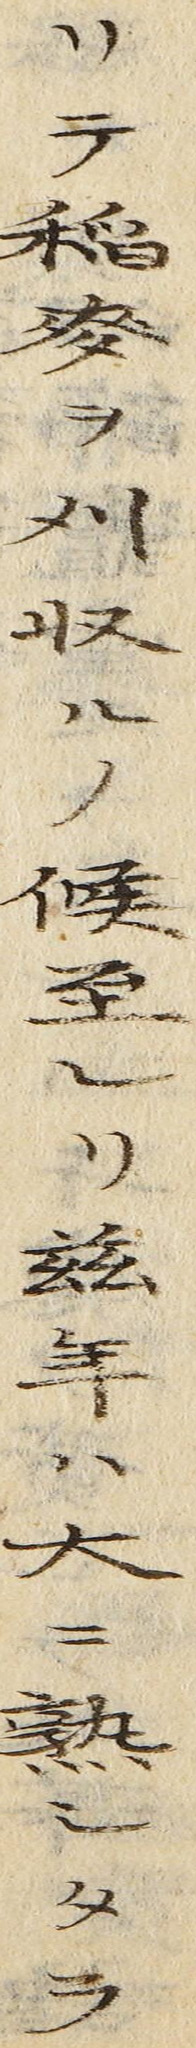リテ稲麦ヲ刈収ルノ候至レリ茲年ハ大ニ熟シタラ
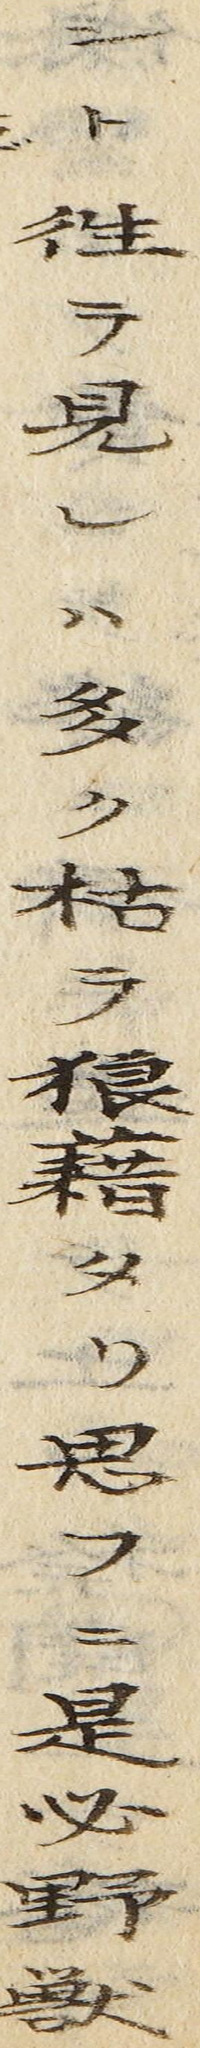ント往テ見レバ多ク枯テ狼藉タリ思フニ是必野獣
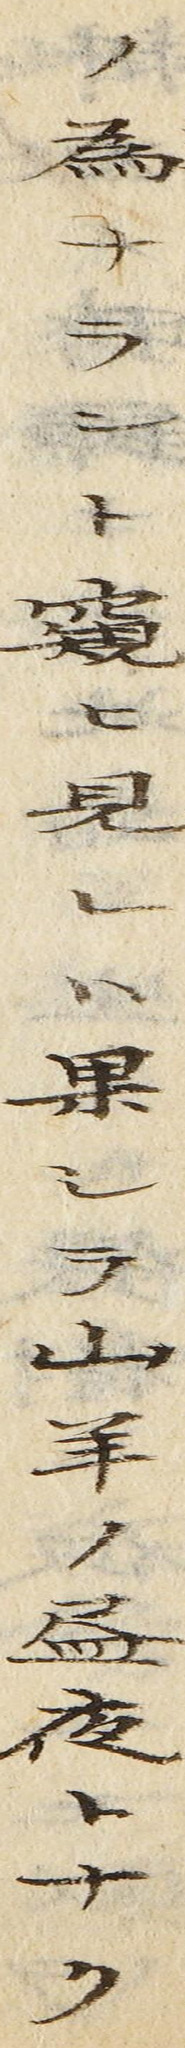ノ為ナラント窺ヒ見レハ果シテ山羊ノ昼夜トナク
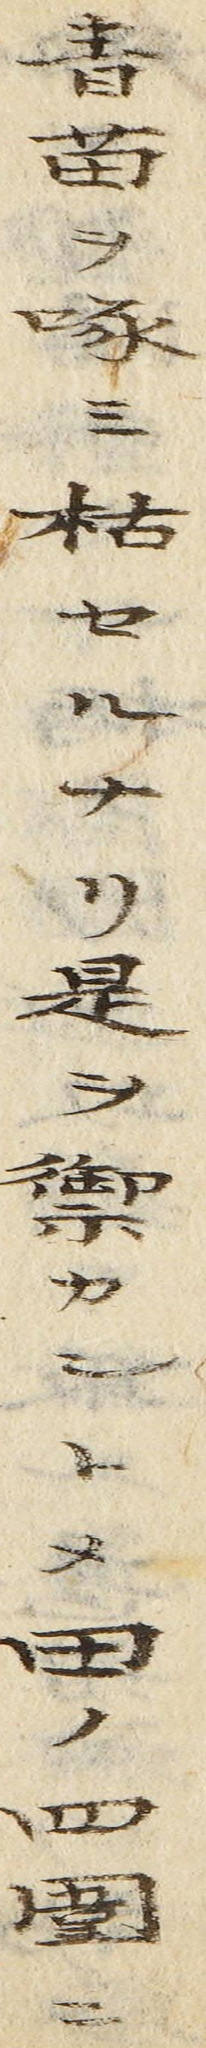青苗ヲ啄ミ枯セルナリ是ヲ禦カントシテ田ノ四囲ニ
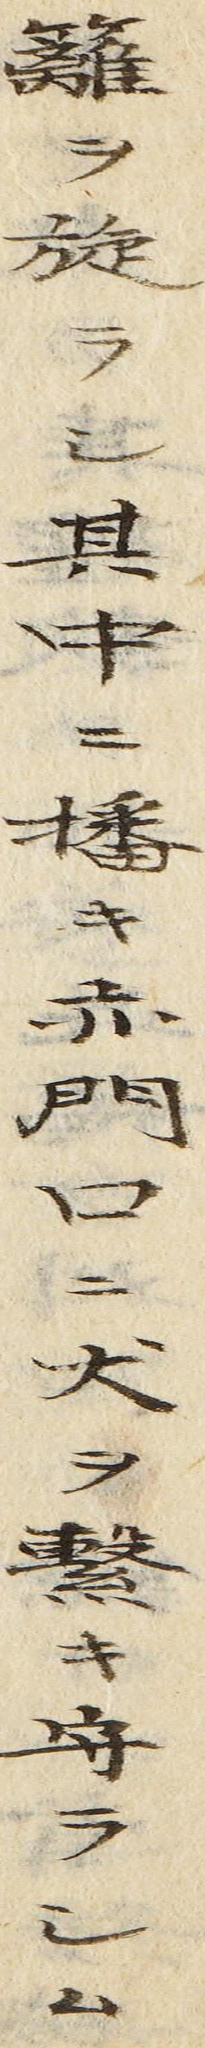籬ヲ旋ラシ其中ニ播キ亦門口ニ犬ヲ繋キ守ラシム
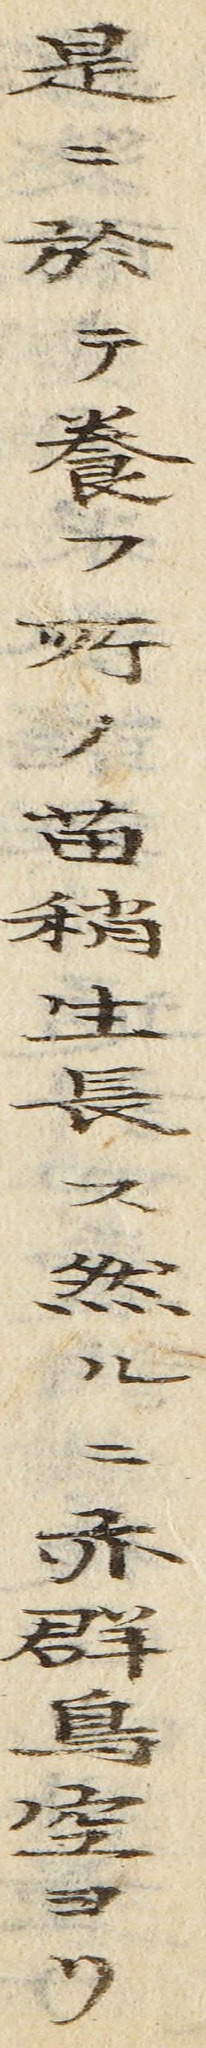是ニ於テ養フ所ノ苗稍生長ス然ルニ亦群鳥空ヨリ
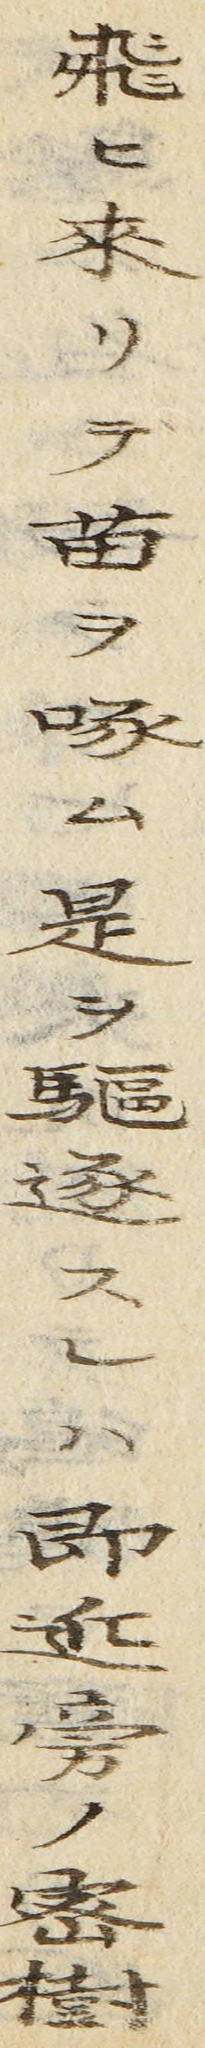飛ヒ来リテ苗ヲ啄ム是ヲ駆逐スレハ即近旁ノ密樹
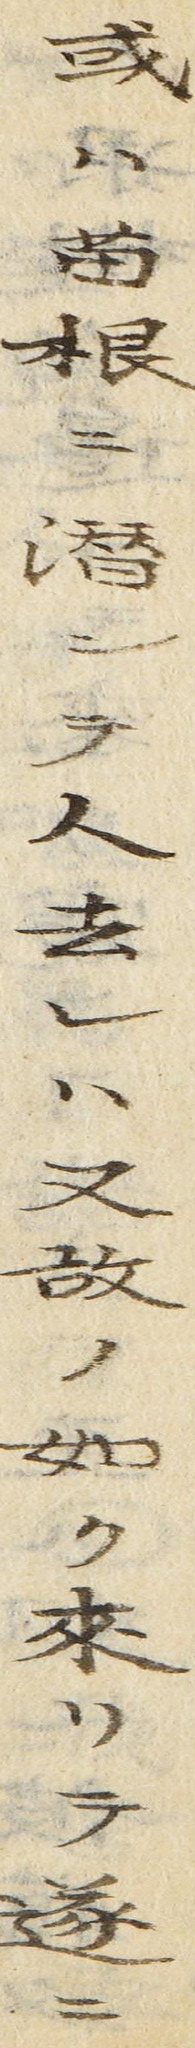或ハ苗根ニ潜ンテ人去レハ又故ノ如ク来リテ遂ニ
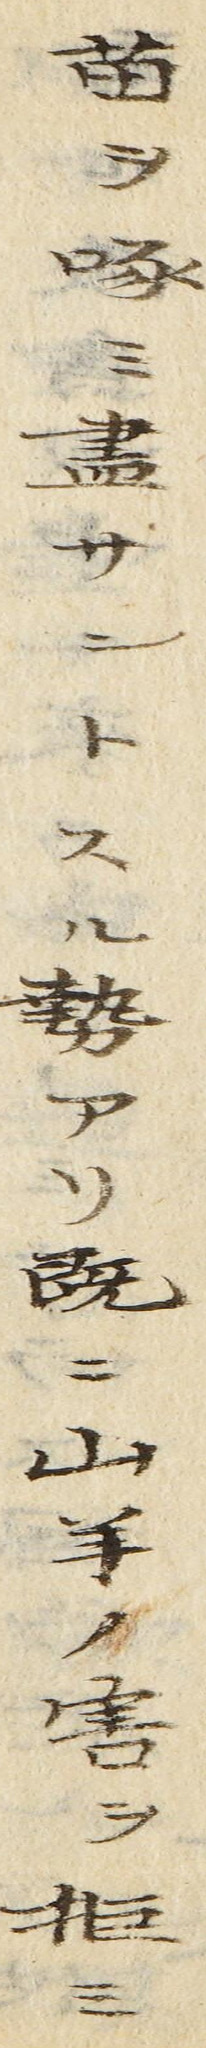苗ヲ啄ミ尽サントスル勢アリ既ニ山羊ノ害ヲ拒ミ
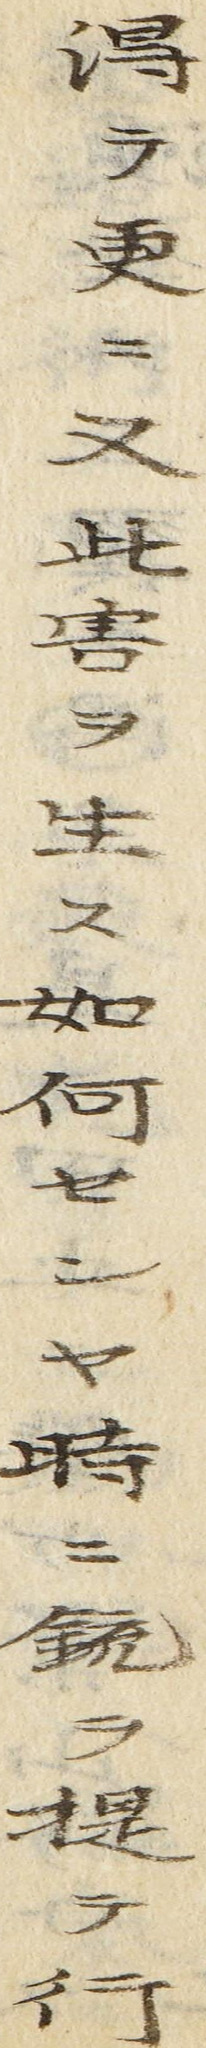得テ更ニ又此害ヲ生ス如何センヤ時ニ銃ヲ提テ行
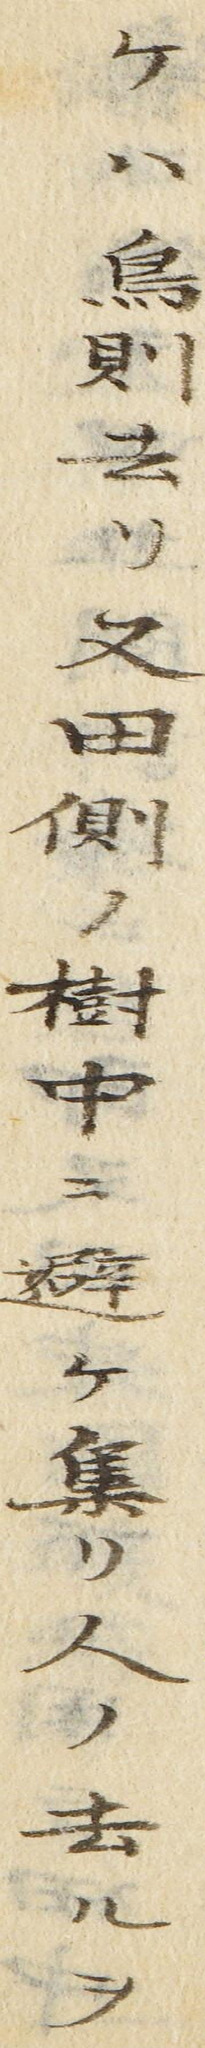ケハ鳥則去リ又田側ノ樹中ニ避ケ集リ人ノ去ルヲ

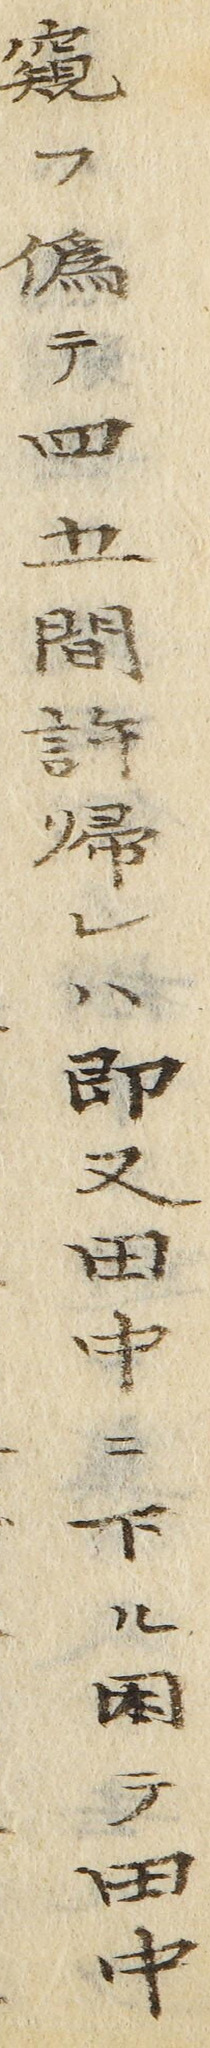窺フ偽テ四五間許帰レハ即又田中ニ下ル困テ田中
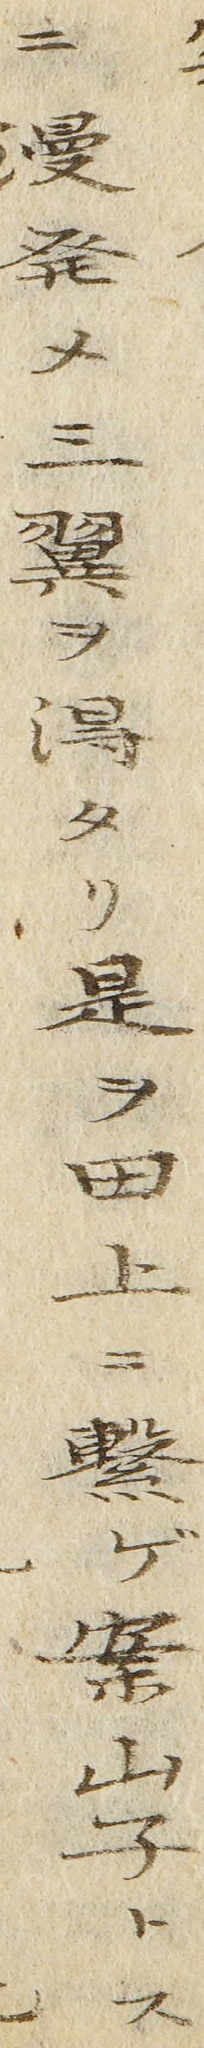ニ漫発シテ三翼ヲ得タリ是ヲ田上ニ繋ゲ案山子トス
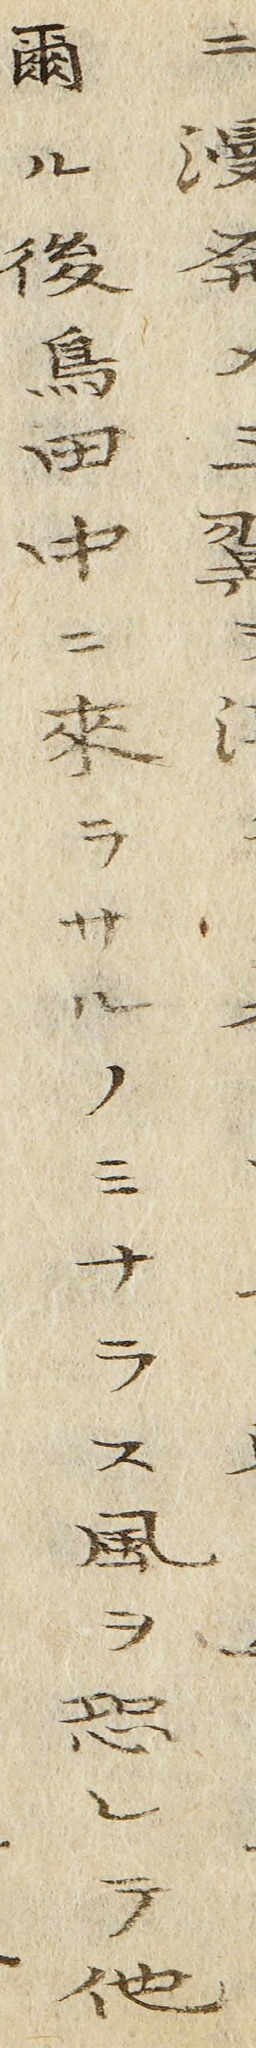爾ル後鳥田中ニ来ラサルノミナラス風ヲ恐レテ他
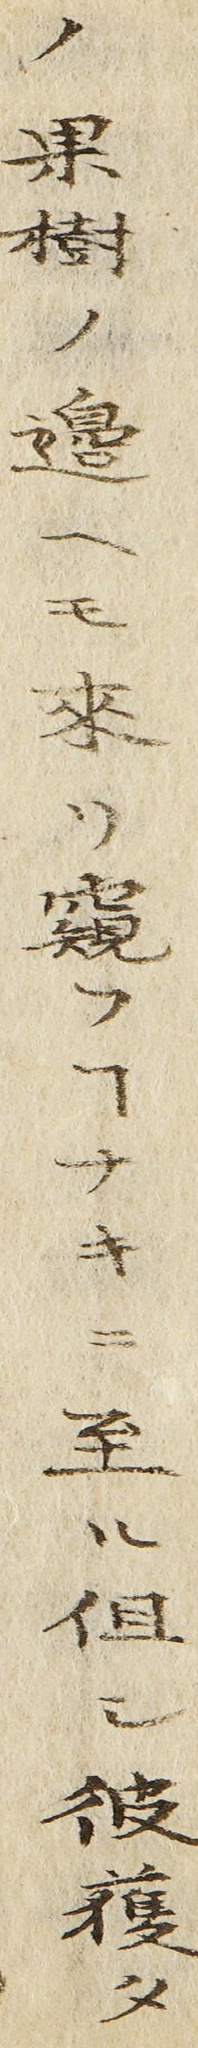ノ果樹ノ辺ヘモ来リ窺フコトナキニ至ル但シ彼獲タ
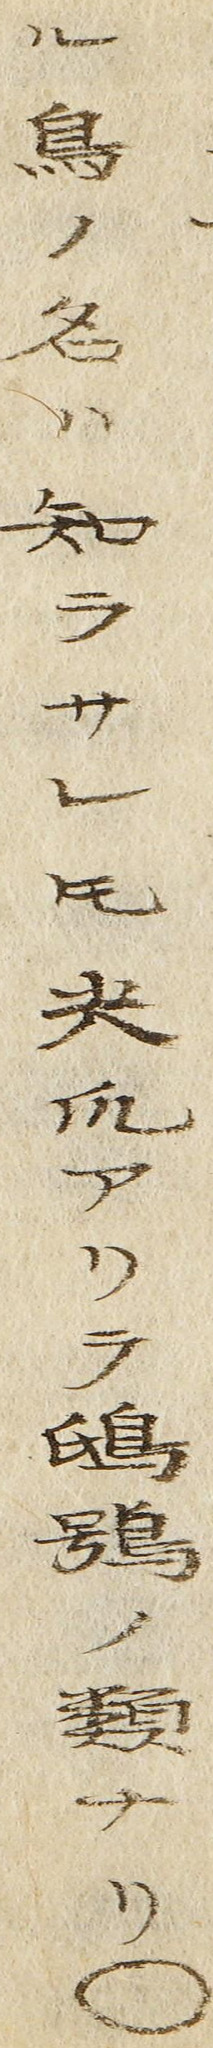ル鳥ノ名ハ知ラサレトモ尖爪アリテ鴟鴞ノ類ナリ◯
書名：漂流紀事
